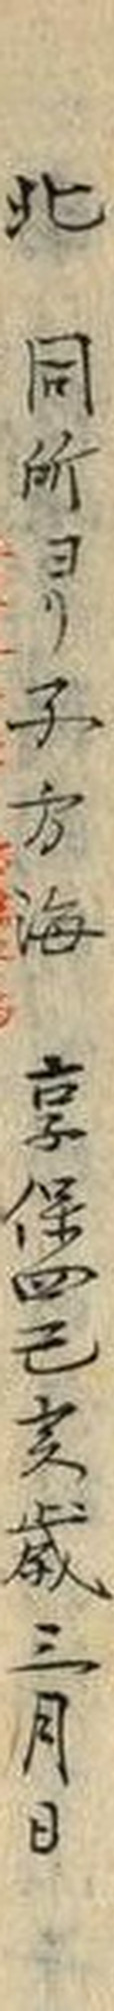北同所ヨリ子方海享保四己亥歳三月日
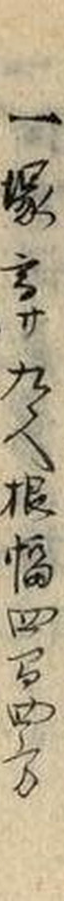一塚高サ九尺根幅四間四方
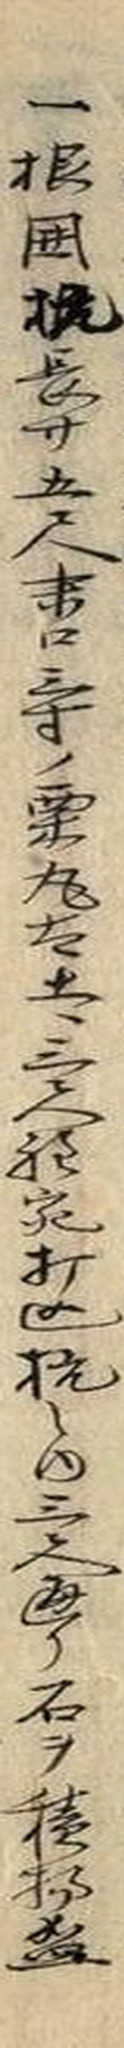一根囲杭長サ五尺末口三寸ノ栗丸太土へ三尺程宛打込杭之内三尺通り石ヲ積揚盛
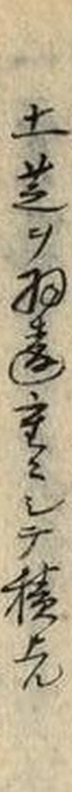土芝ヲ羽違重ニシテ積上ル
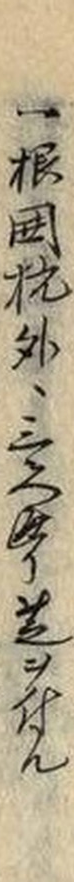一根囲杭外へ三尺通り芝ヲ付ル
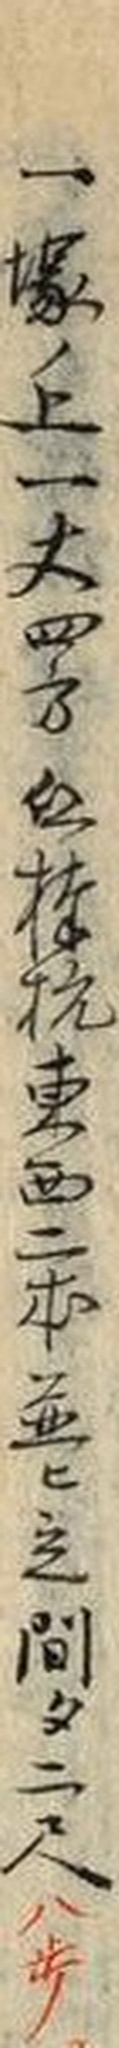一塚ノ上一丈四方但棒杭東西二本並ヒ立間タ二尺八歩同断
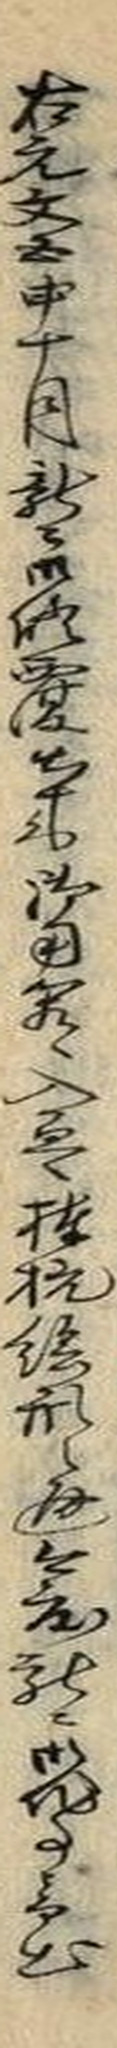右元文五申十月新ニ御修覆出来御用箱へ入置候棒杭絵形之通今度新ニ御作事ニ而出
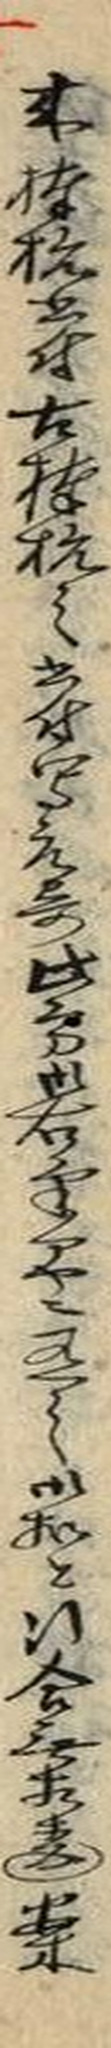来棒杭書付右棒杭之書付写取寄此方御右筆部ヤニ有之御控と引合無相違案

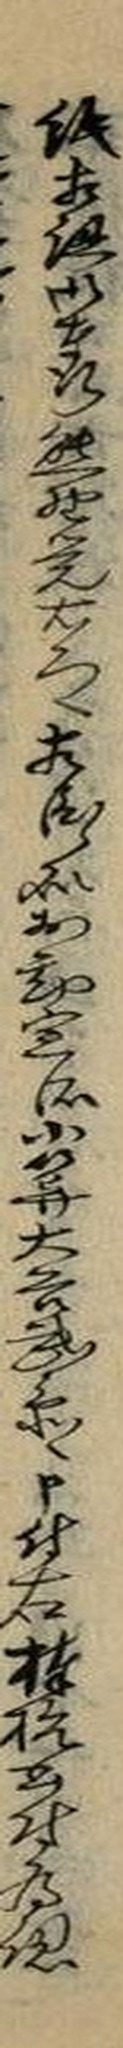紙相認御奉行熊野覚右衛門へ相渡候処於勘定所小算大谷武兵衛へ申付右棒杭書付為認
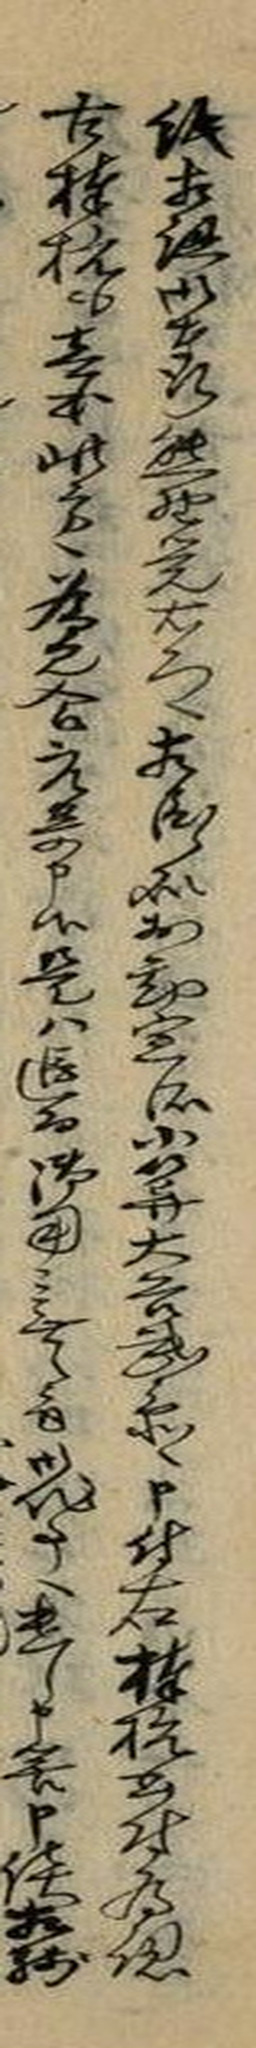右棒杭も壱本此方へ為見合取寄申候是ハ追而御用ニ無之ニ付御作事へ遣し申筈申談相残
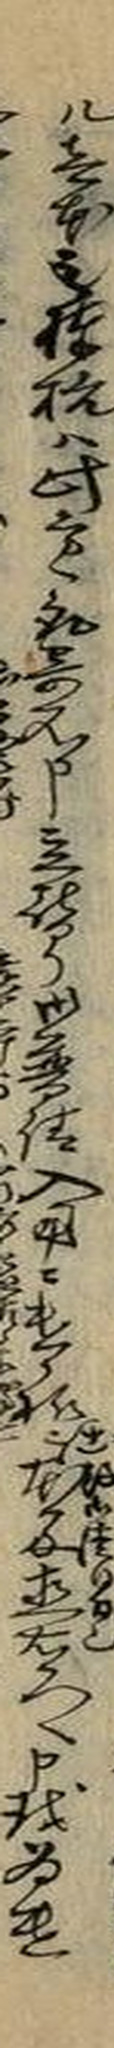ル壱本之棒杭ハ此方へ取寄不申立替り御普請入用ニ遣候様出役御徒目付也本多直右衛門へ申越為遣
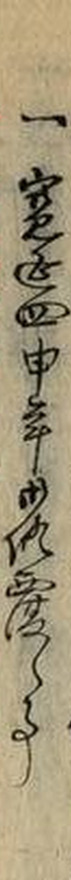一寛延四申年御修覆之事
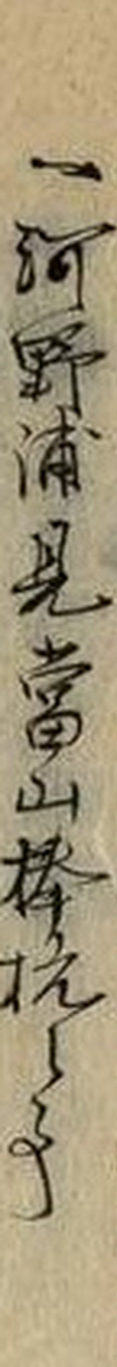一河野浦見当山棒杭之事
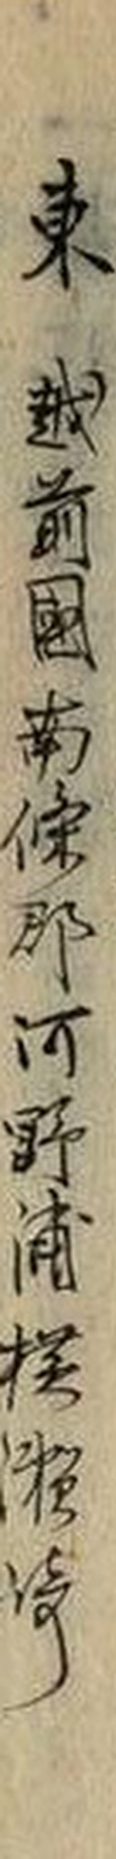東越前国南條郡河野浦横瀬崎
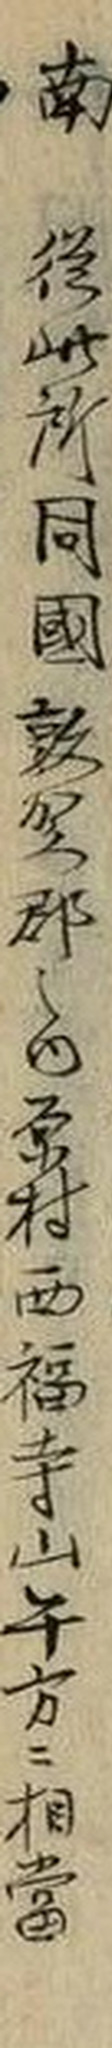南従此所同国敦賀郡之内原村西福寺山午方ニ相当
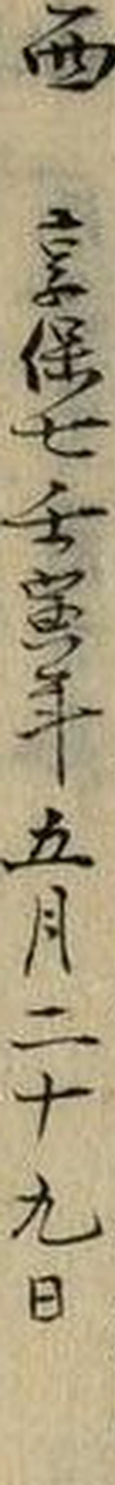西享保七壬寅年五月二十九日
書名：御国他国諸事之部
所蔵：福井県文書館 Fukui Prefectural Archives
